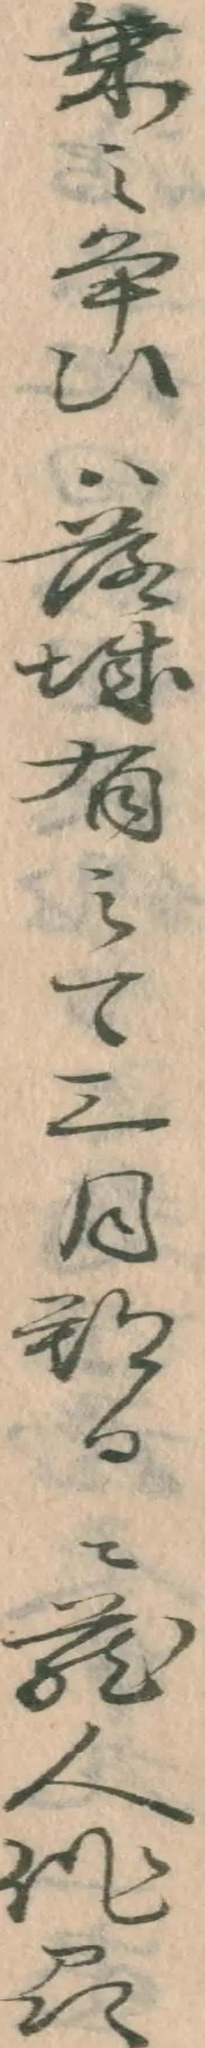乗之争ひは落城有之て三月朔日に落人作州
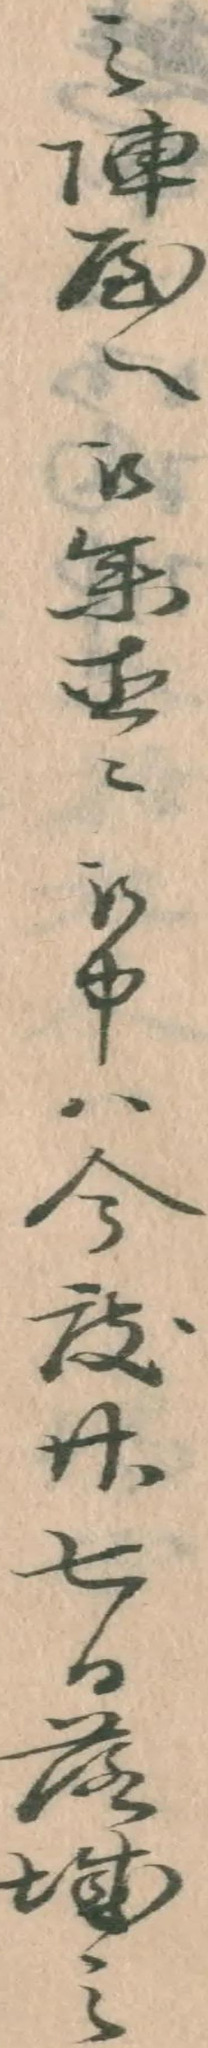之陣屋へ被参直に被申は今度廿七日落城之
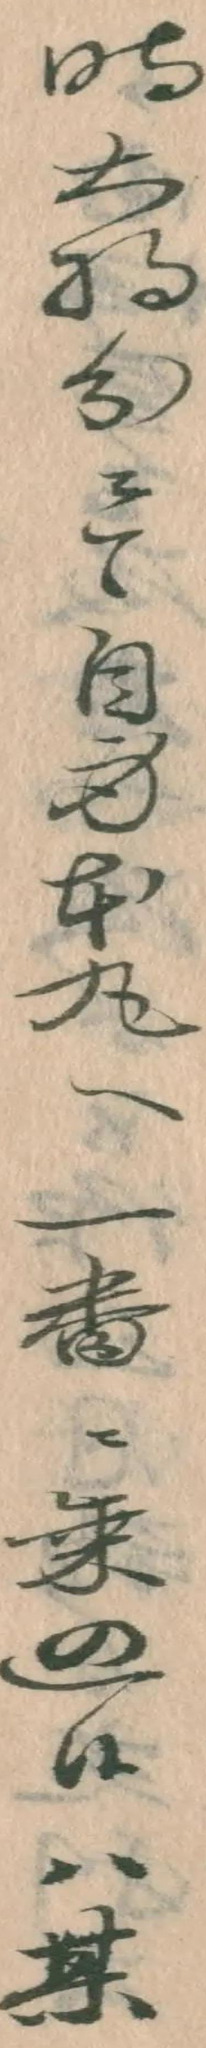時大将分にて自身本丸へ一番に乗込候は某
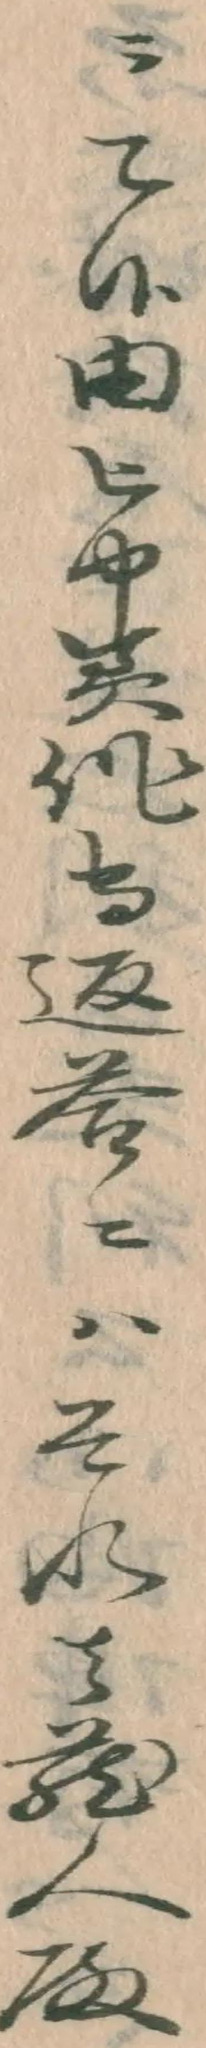にて候由被申美作守返答にはそれ者蔵人殿
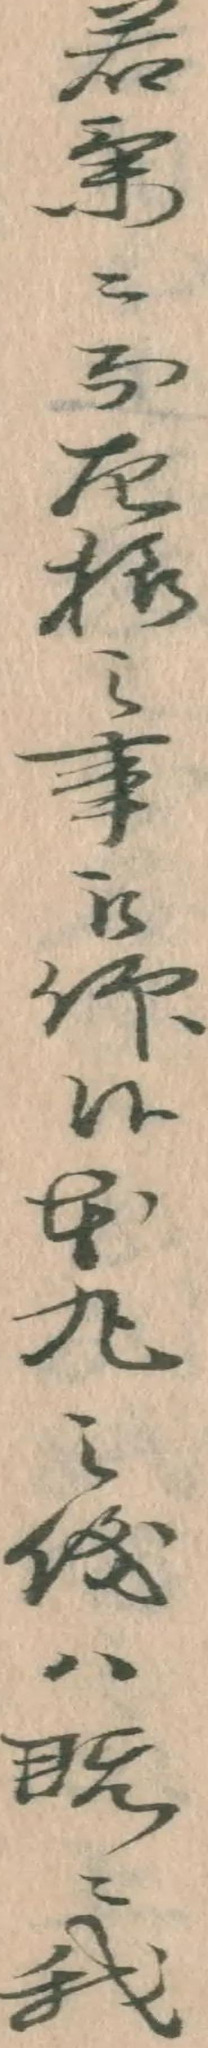若気に而左様之事被仰候本丸之儀は既に我
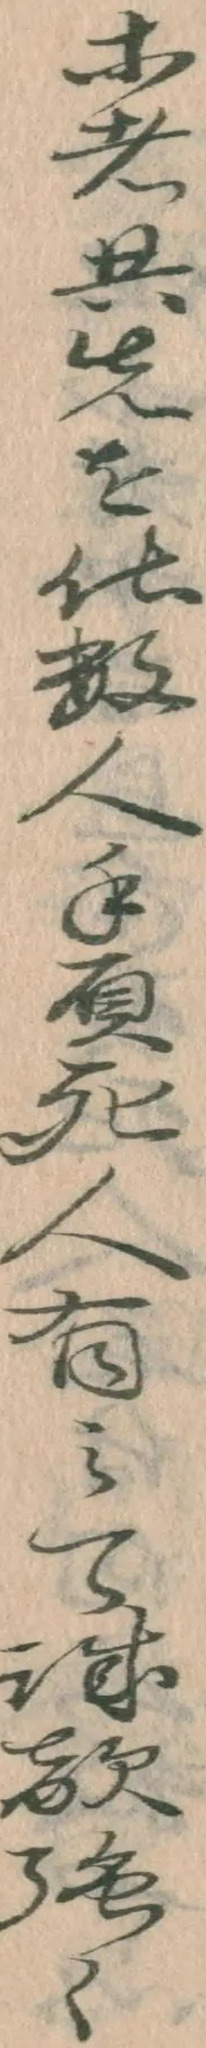等者共先を仕数人手負死人有之て誅敵強く
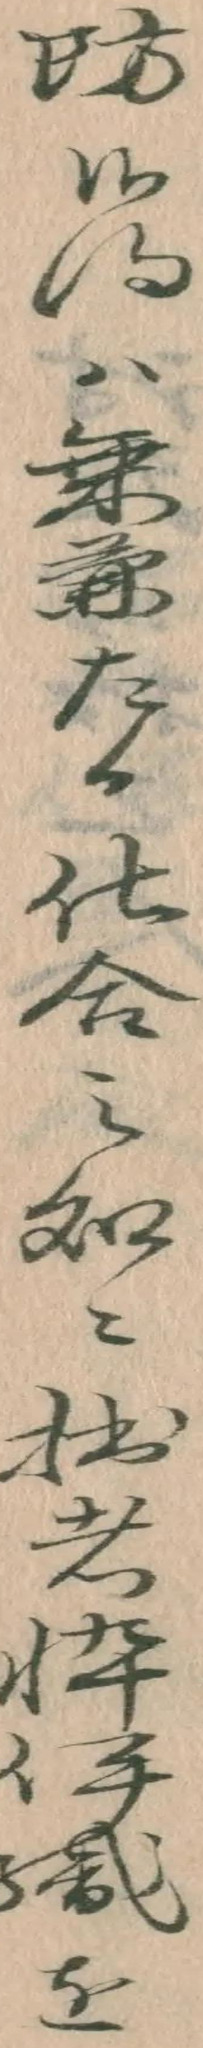防候得は乗兼たる仕合之処に拙者忰伊織を
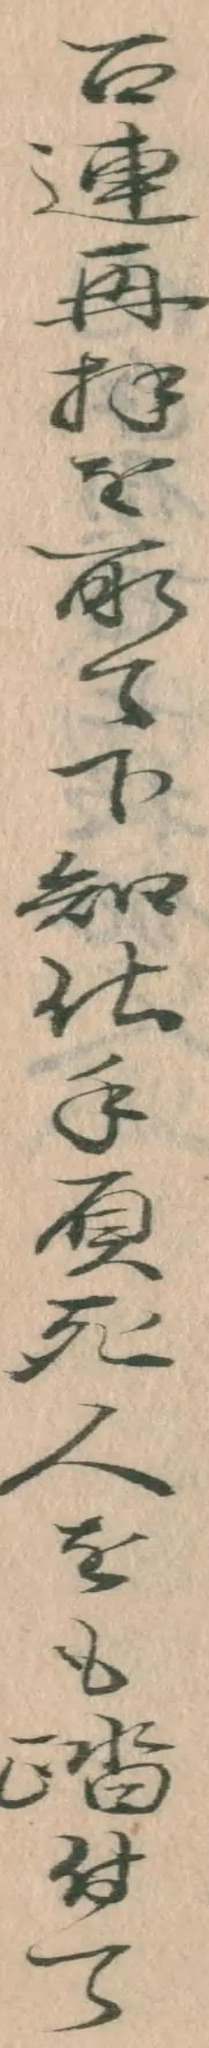召連再拝を取て下知仕手負死人をも踏付て
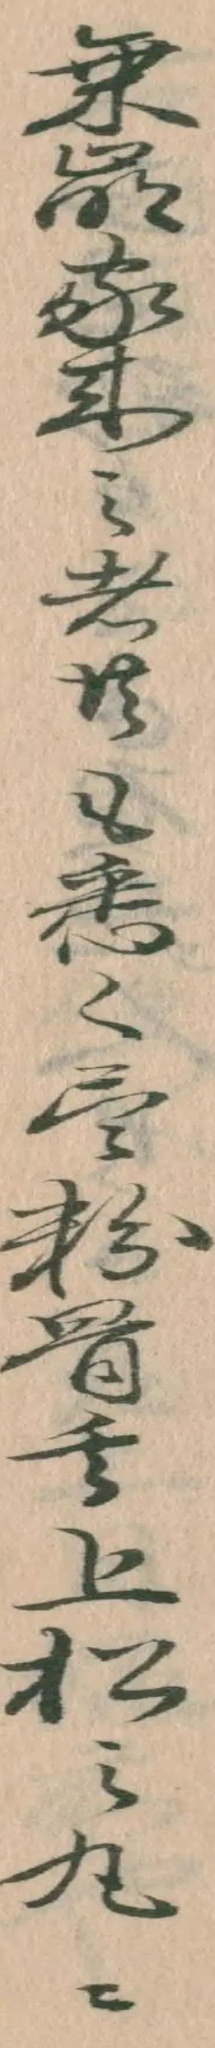乗崩家来之者共も悉く尽粉骨其上松之丸に
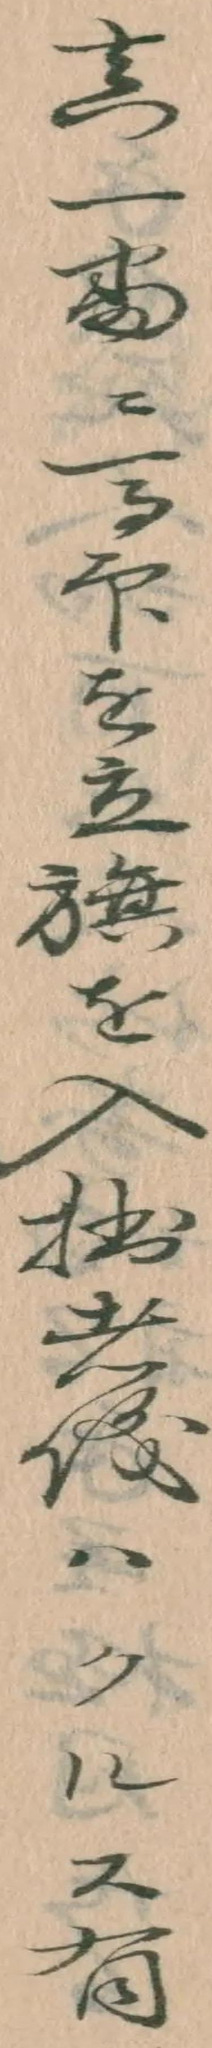真一番に馬印を立旗を入拙者偽はくるす有
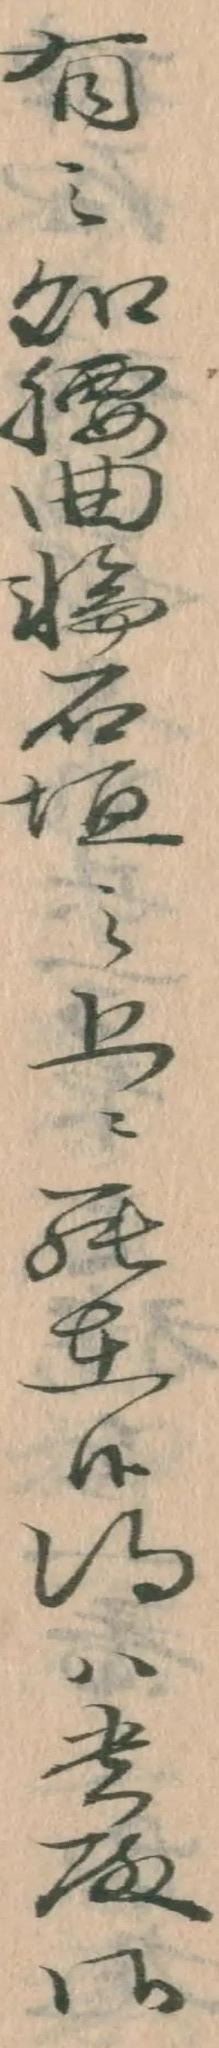有之処腰曲輪石垣之上に罷在候得は貴殿御
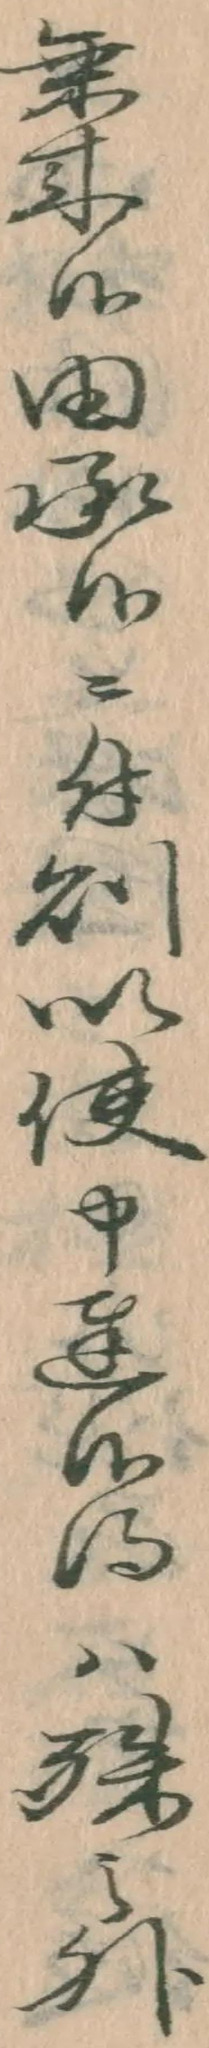乗来候由承候に付則以使申達候得は殊之外
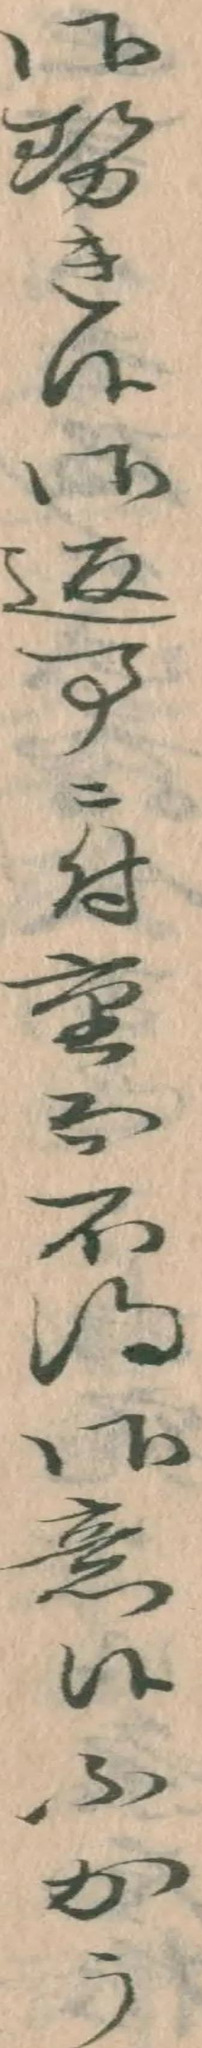御勢き候御返事に付重而不得御意候ふかう
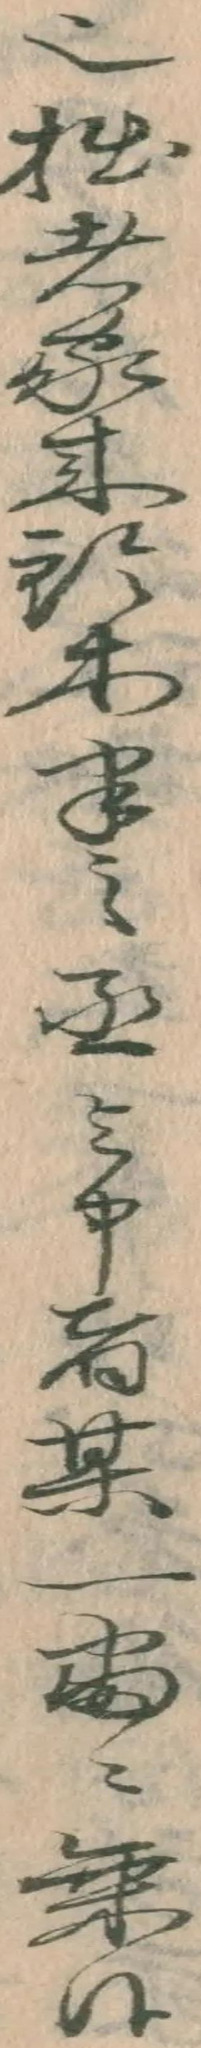也拙者家来鈴木半之丞与申者某一番に乗候
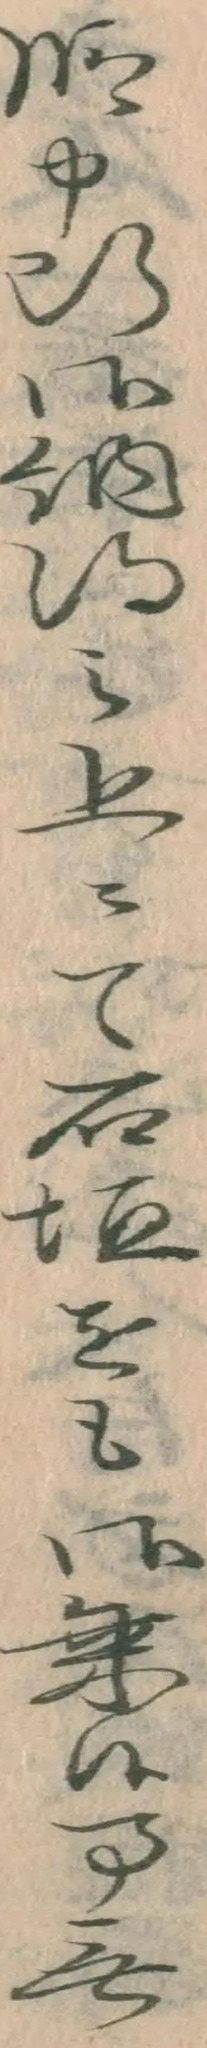段申断御納得之上にて石垣をも御乗候事無
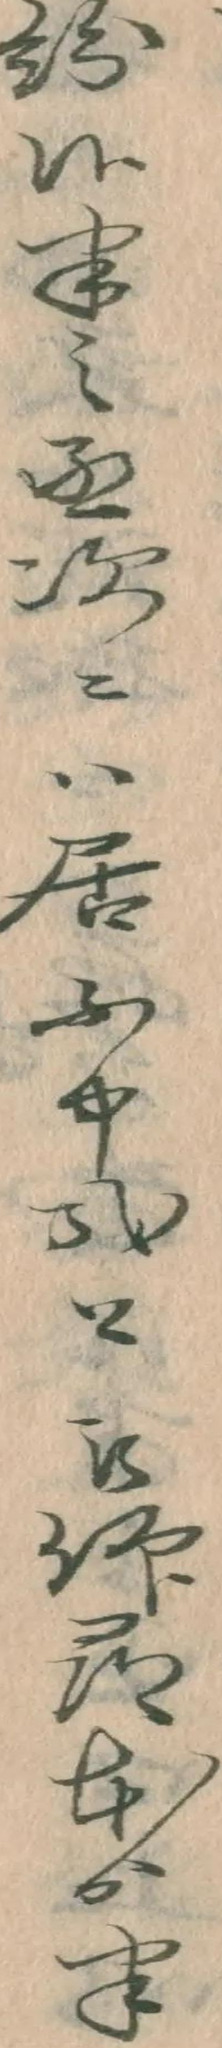紛候半之丞次には居ふ申哉と被仰尋本ゟ半
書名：切支丹御退治記 49巻. [9]
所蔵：国立国会図書館 National Diet Library, JAPAN
